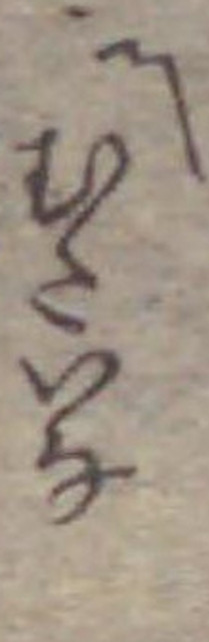〽むたいな
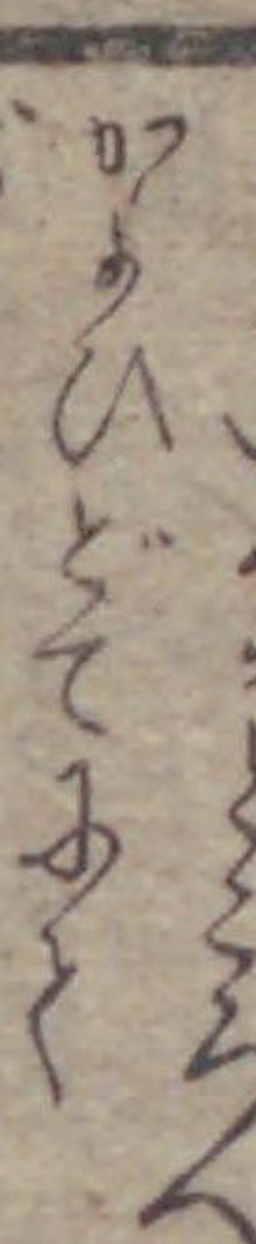かよひどてにて
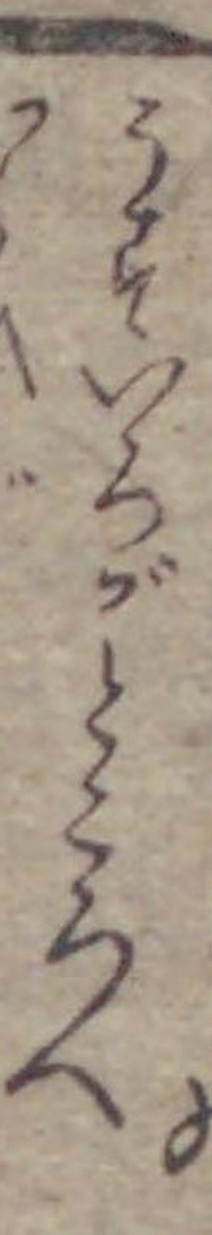うすいろがところへ
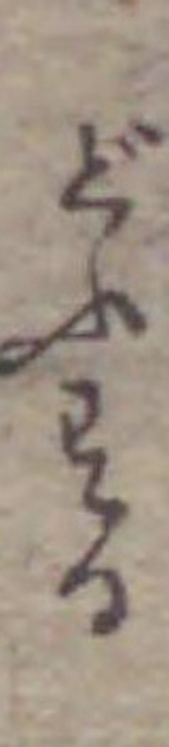どふわる
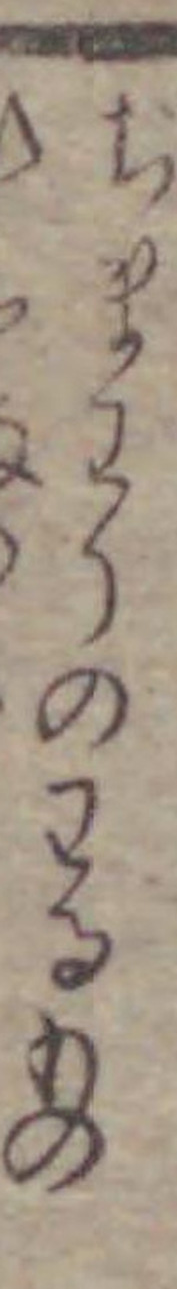ぢまわりのわるもの
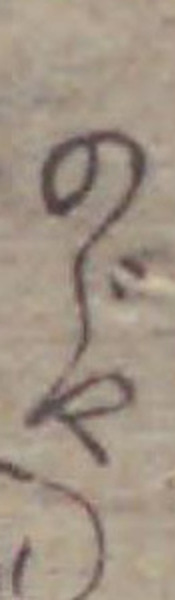のじや
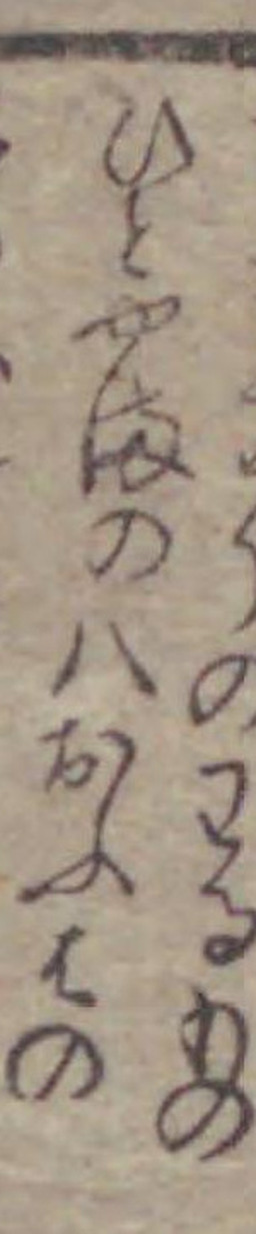ひとやまの八おふはの
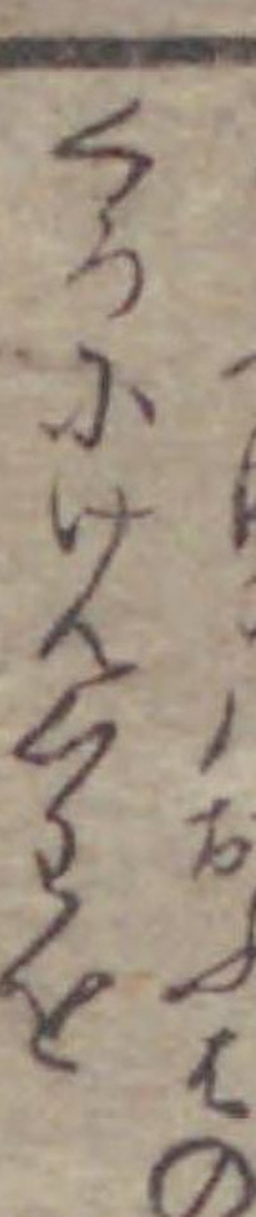くろにけんくわを
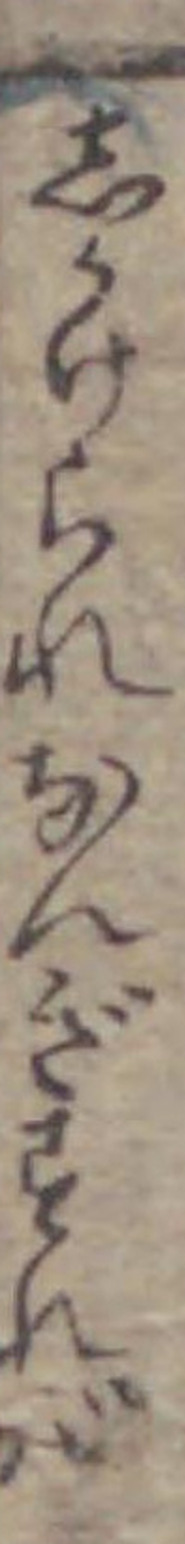しかけられなんぎすれが
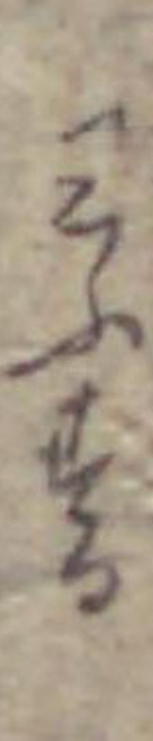〽たふする
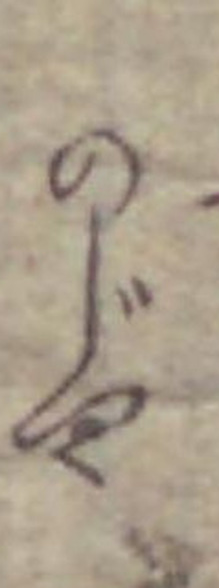のじや
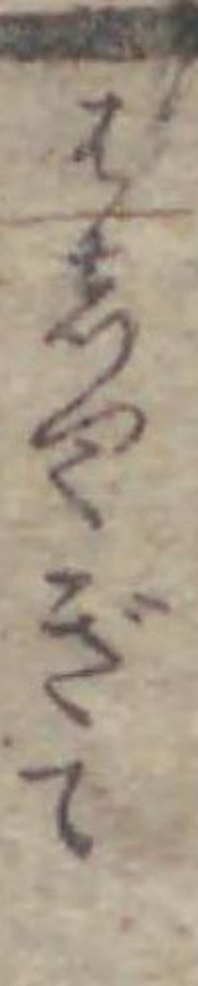はしやぎて
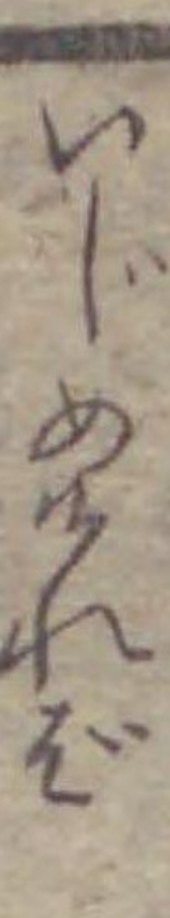いじめければ
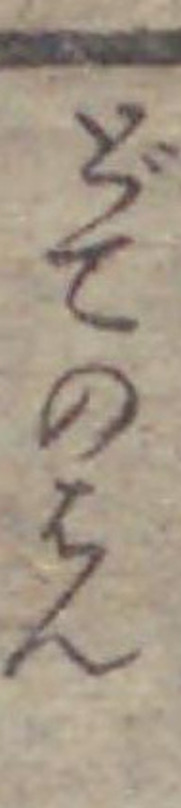どてのはん
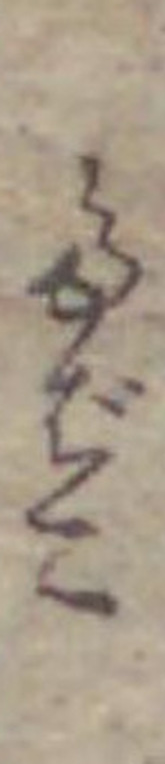たばこ
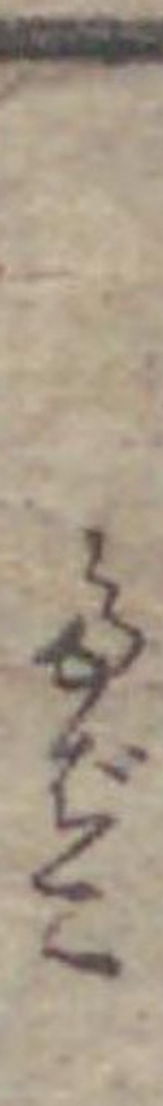たばこ
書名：談芭菰誉詞 : 3巻
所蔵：国立国会図書館 National Diet Library, JAPAN
